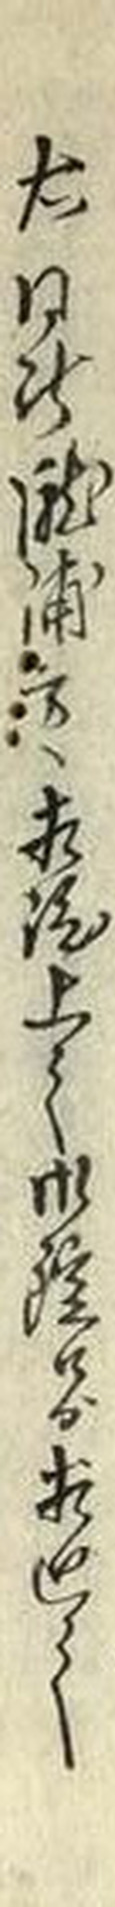右同断滝浦方へ相渡上之御錠口ゟ相廻之
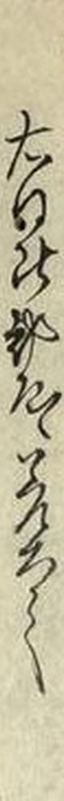右同断部屋へ差出之
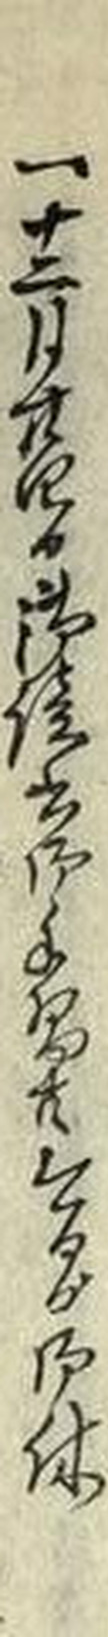一十二月廿四日御読書御手習共今日ゟ御休
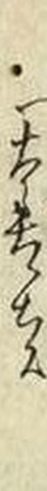大奥へ出ス
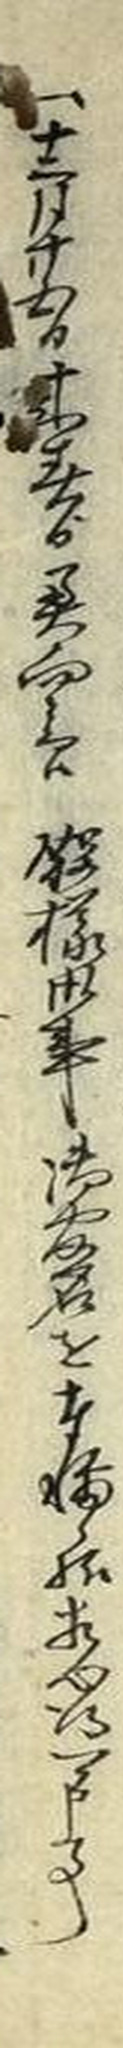一十二月廿五日来春ゟ奥向ニ而ハ殿様御事御官名を奉称候様相心得可申事

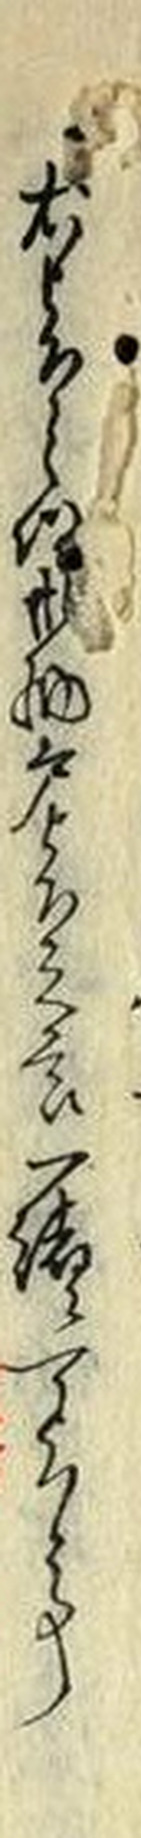右被下之但御納戸被下之節一緒ニ可被下候事
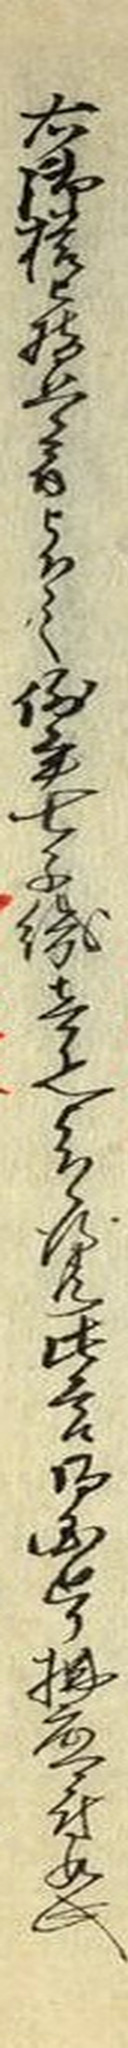右御櫛被指上候ニ付被下之例年七子織壱疋被下候得共此節御国廻り払底ニ付如此
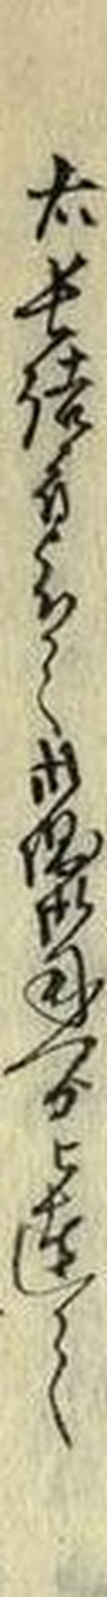右長詰ニ付被下之御側御用人ゟ被達之
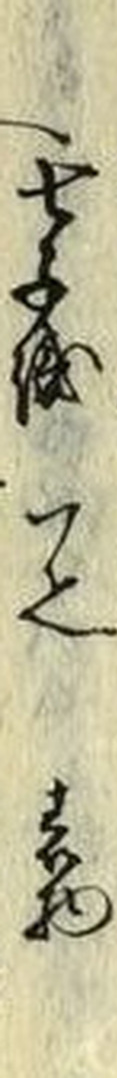七子織一疋表物
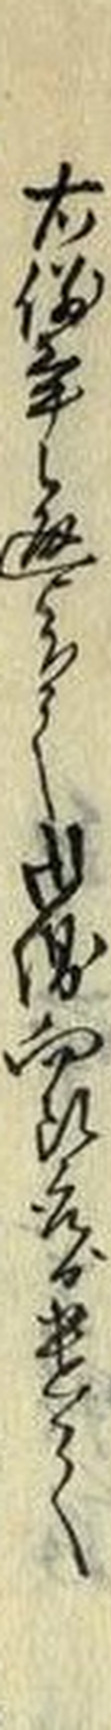右例年之通被下之御側向頭取ゟ遣之
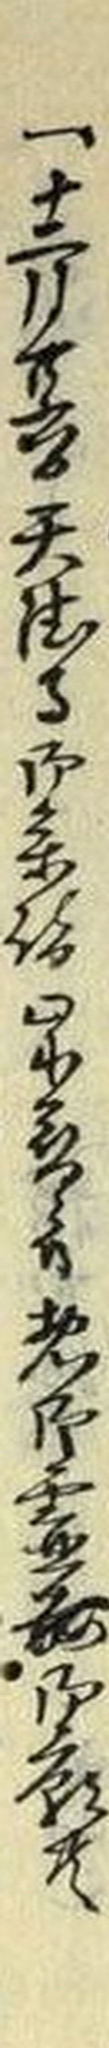一十二月廿六日天徳寺御参詣歳暮ニ付惣御霊前御廟共
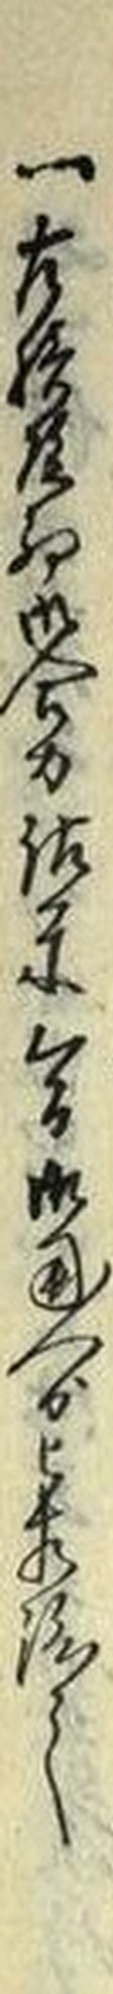一左膳殿初御合力銀米今日御用人ゟ被相渡之
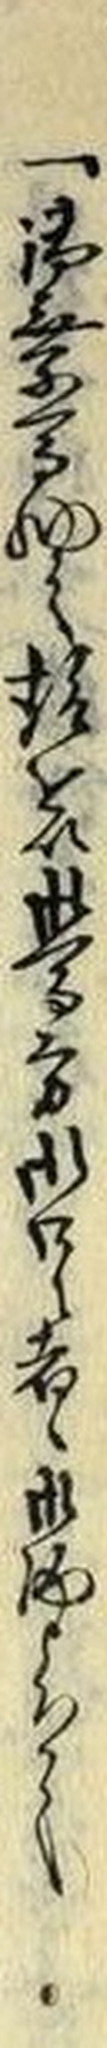一御乗馬納之趣を以御馬方御口之者へ御酒被下之
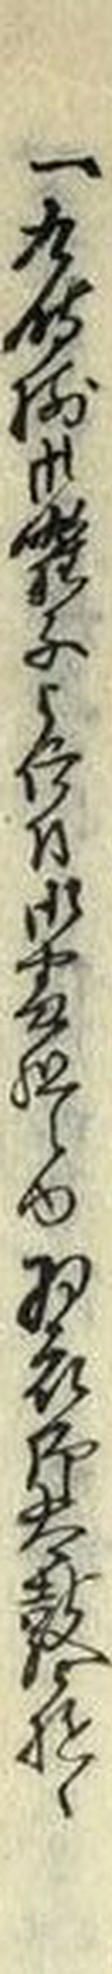一九時揃御囃子被仰付御番組之内羽衣御太鼓被遊候
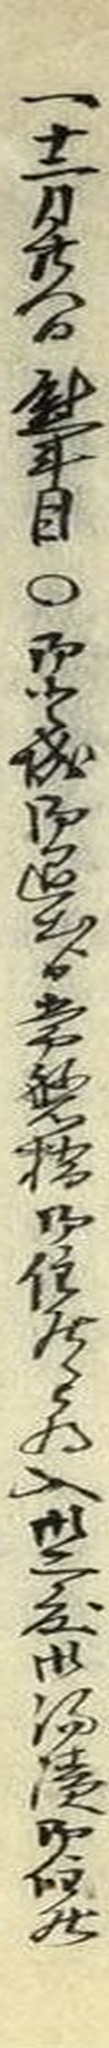一十二月廿八日熨斗目〇御登城御退出ゟ常盤橋御住居へ被為入御二度御湯漬御住居
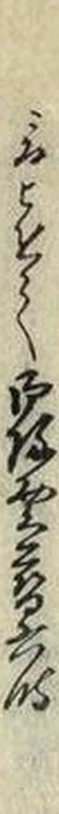ニ而被進之御帰殿暮六時
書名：少傅日録抄（斉善付側向頭取日記、在府）
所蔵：福井県文書館 Fukui Prefectural Archives
